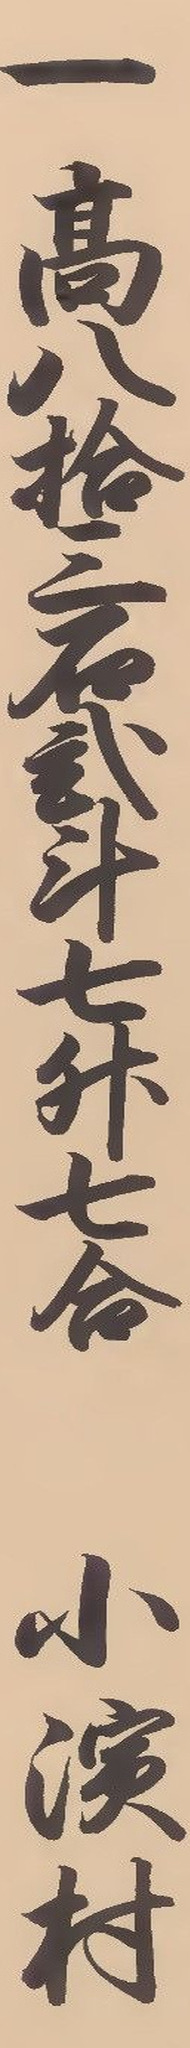一高八拾三石弐斗七升七合小浜村

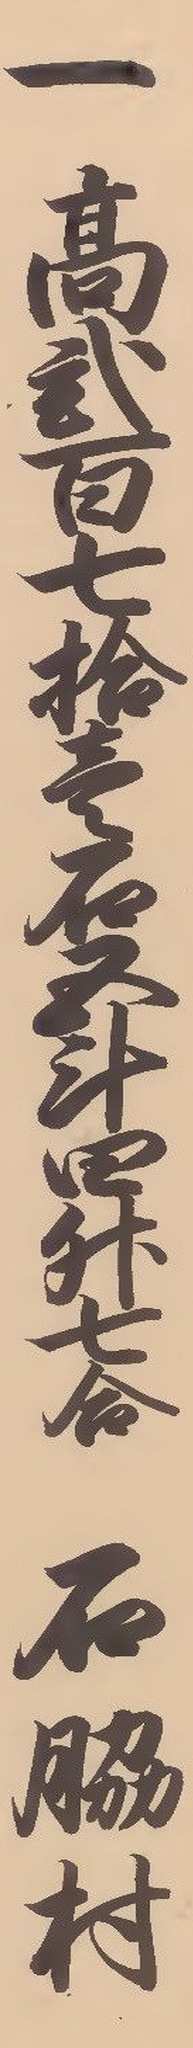一高弐百七拾壱石五斗四升七合石脇村
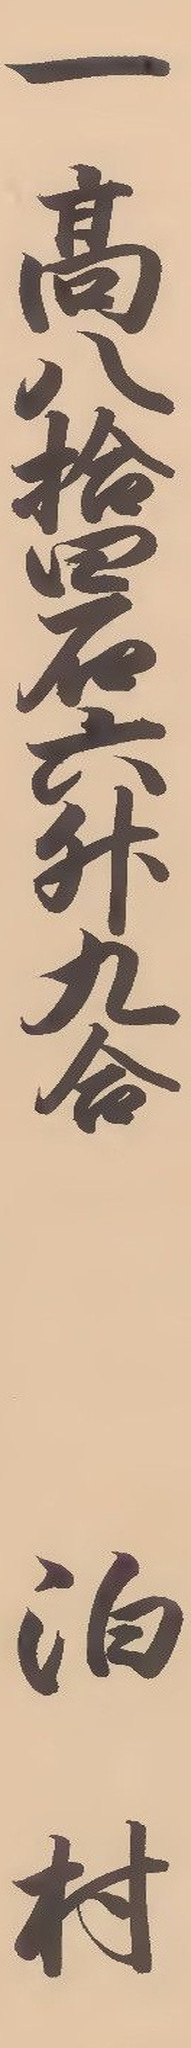一高八拾四石六升九合泊村
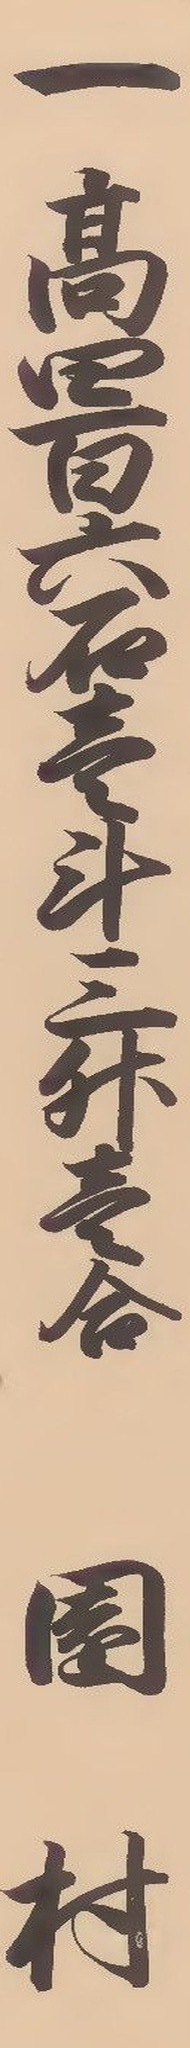一高四百六石壱斗三升壱合園村
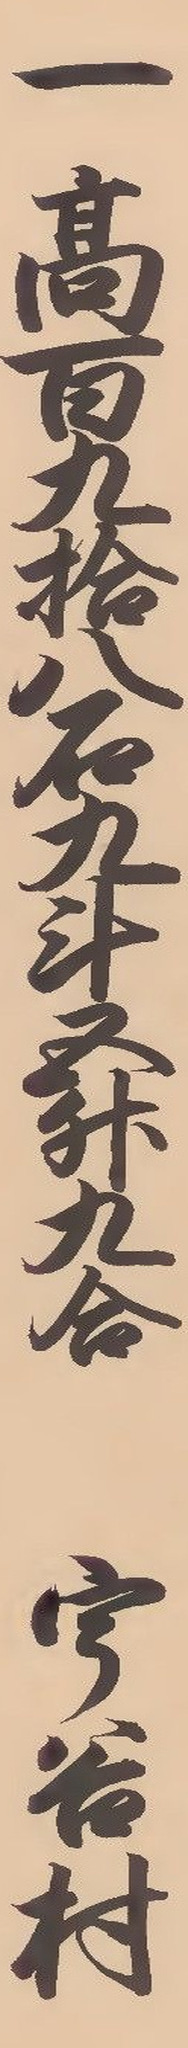一高百九拾八石九斗五升九合宇谷村
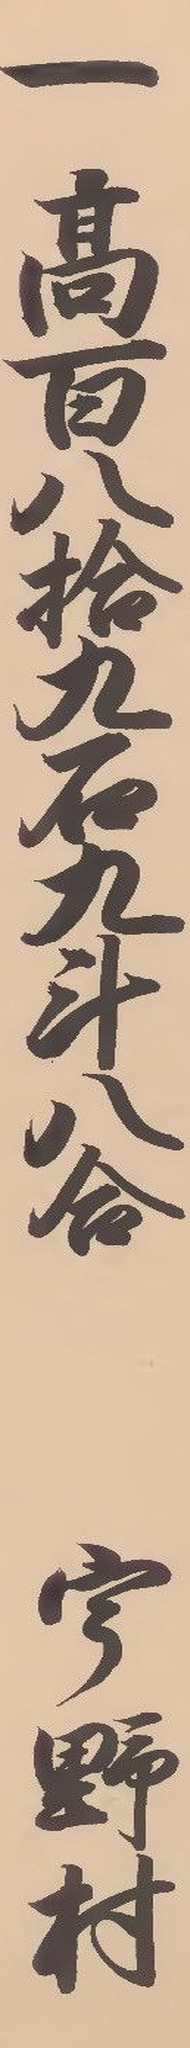一高百八拾九石九斗八合宇野村
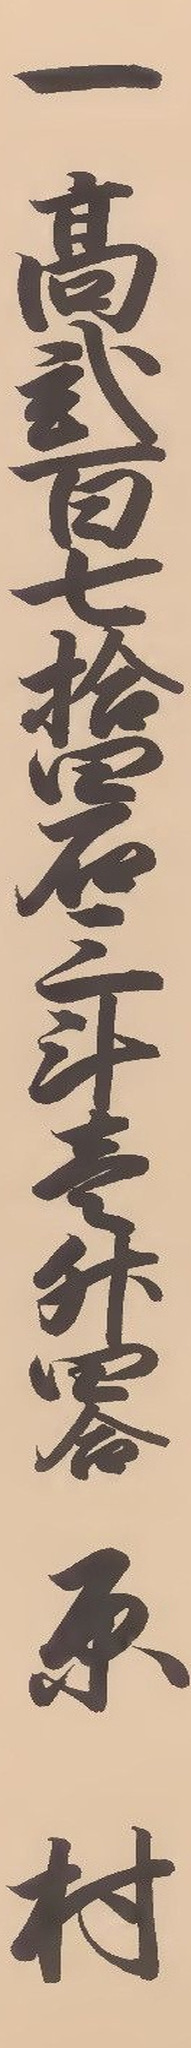一高弐百七拾四石三斗壱升四合原村
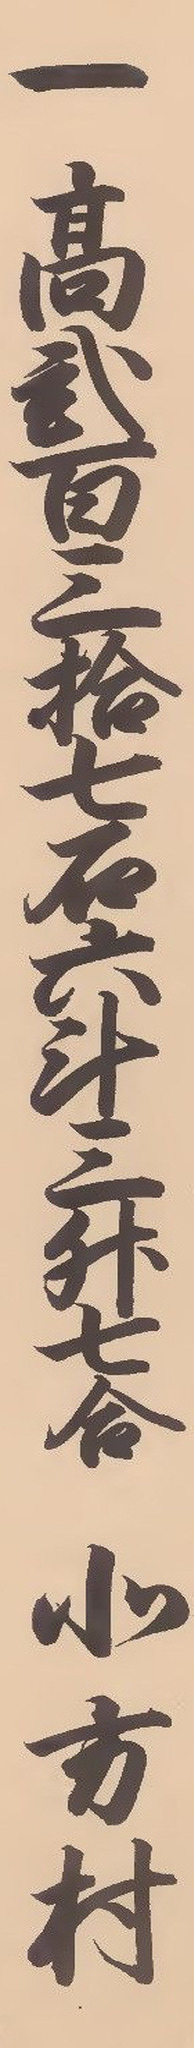一高弐百三拾七石六斗三升七合北方村

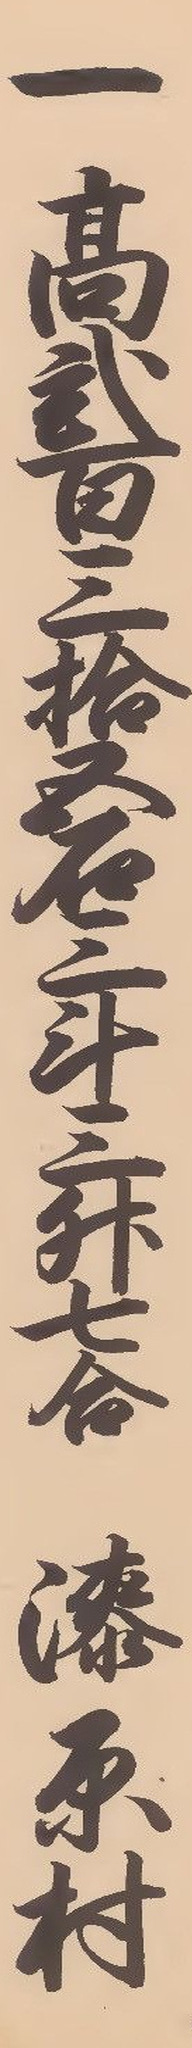一高弐百三拾五石三斗三升七合漆原村
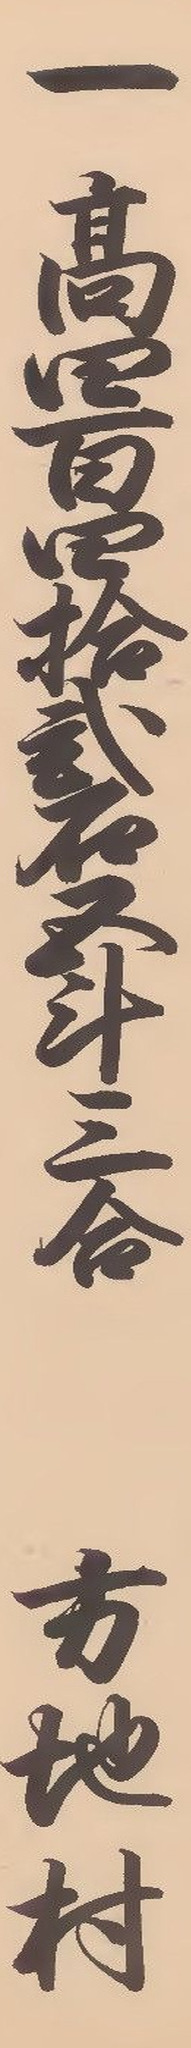一高四百四拾弐石五斗三合方地村
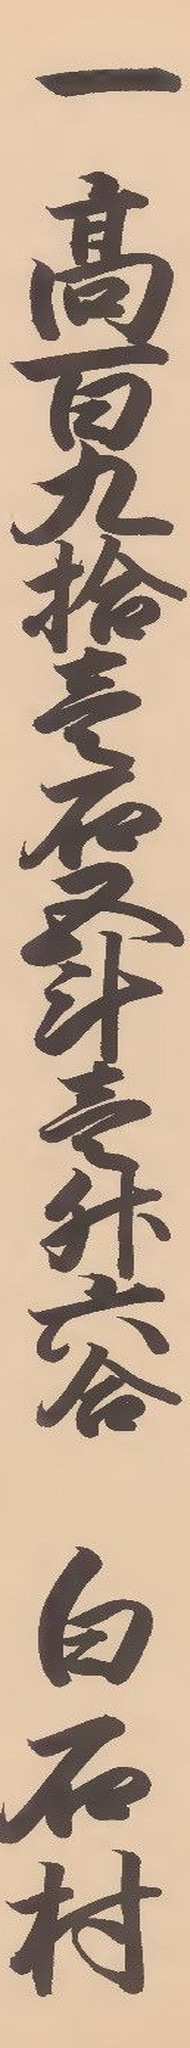一高百九拾壱石五斗壱升六合白石村
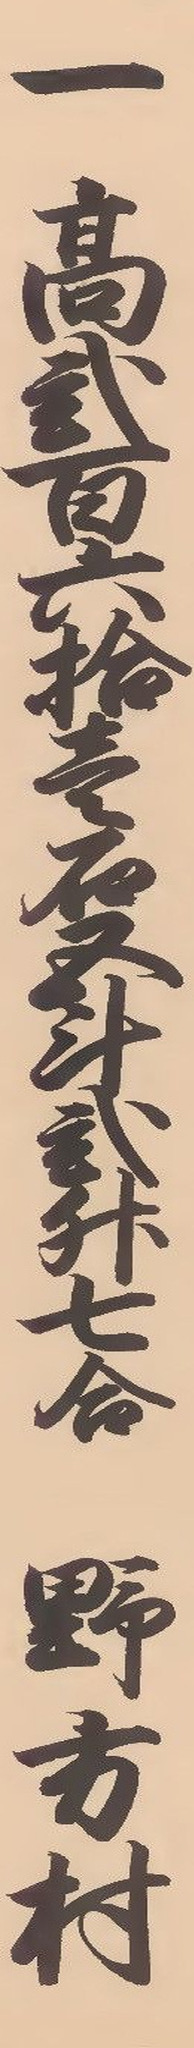一高弐百六拾壱石五斗弐升七合野方村
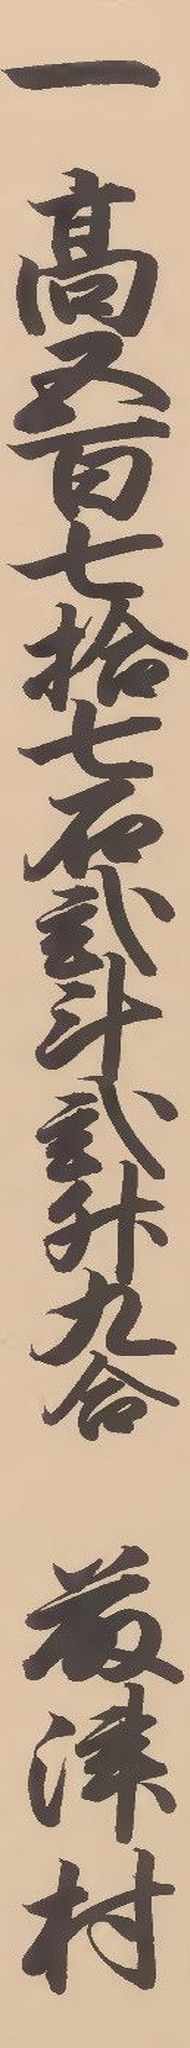一高五百七拾七石弐斗弐升九合藤津村
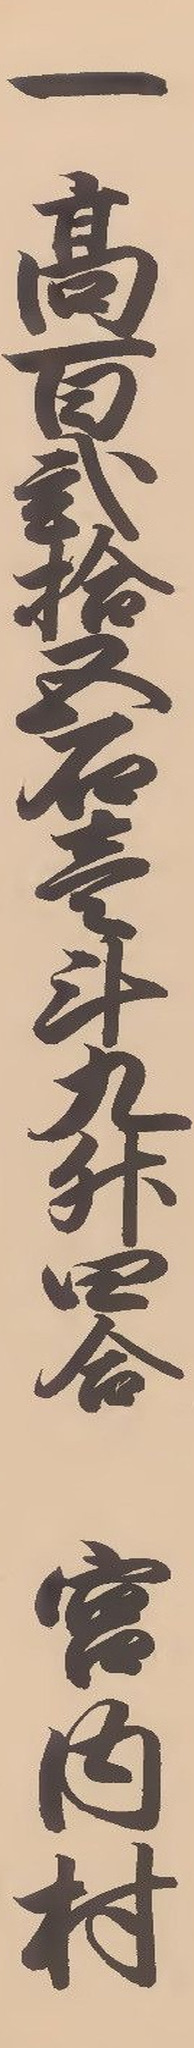一高百弐拾五石壱斗九升四合宮内村
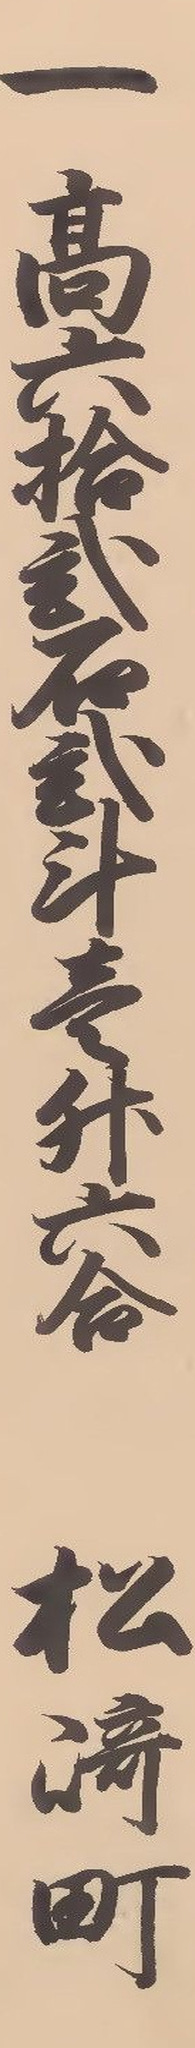一高六拾弐石弐斗壱升六合松崎町
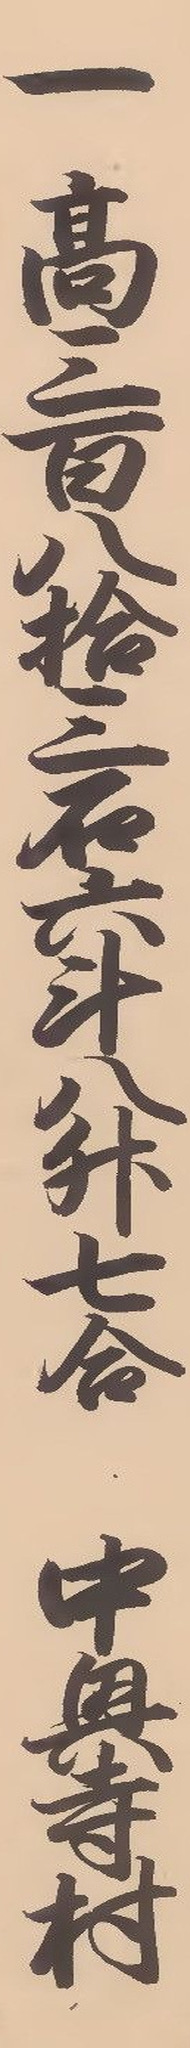一高三百八拾三石六斗八升七合中興寺村
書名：伯耆国郷帳
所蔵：国立公文書館 National Archives of Japan
